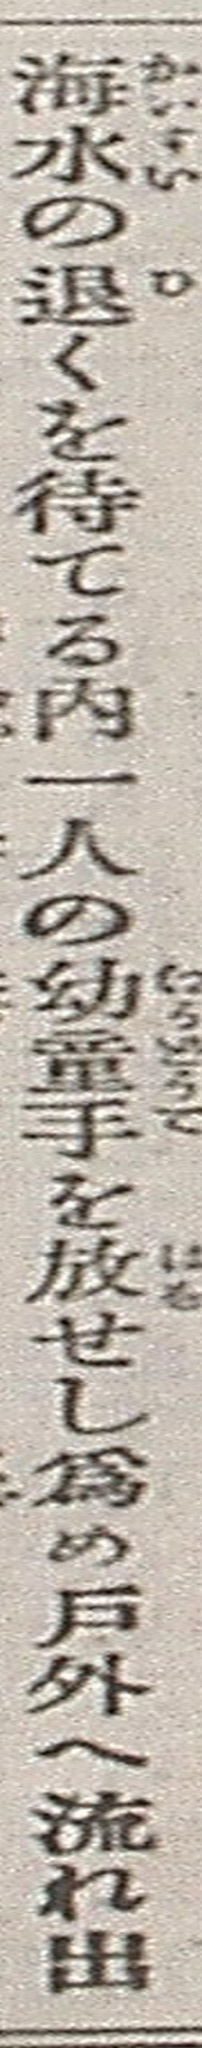海水の退くを待てる内一人の幼童手を放せし為め戸外へ流れ出
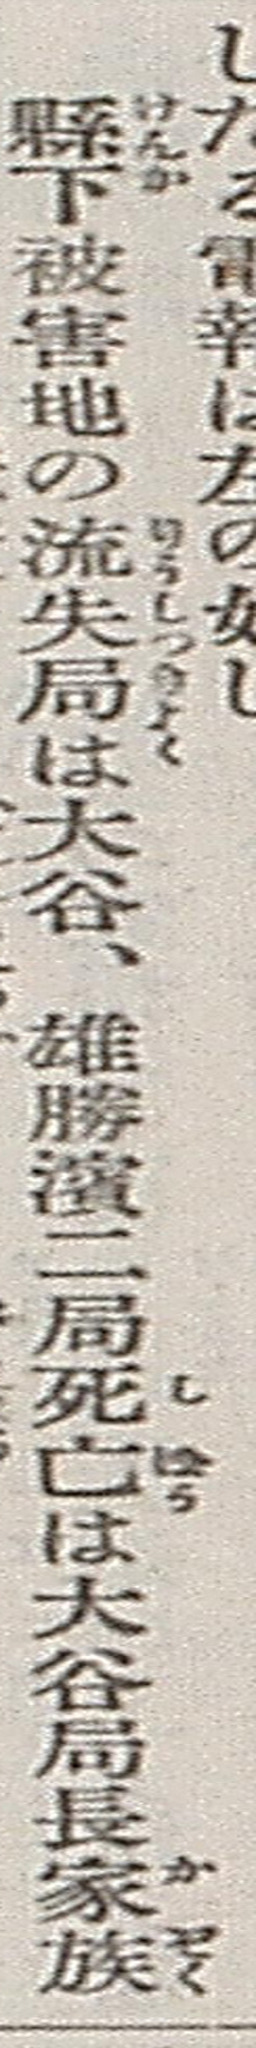県下被害地の流失局は大谷、雄勝浜二局死亡は大谷局長家族
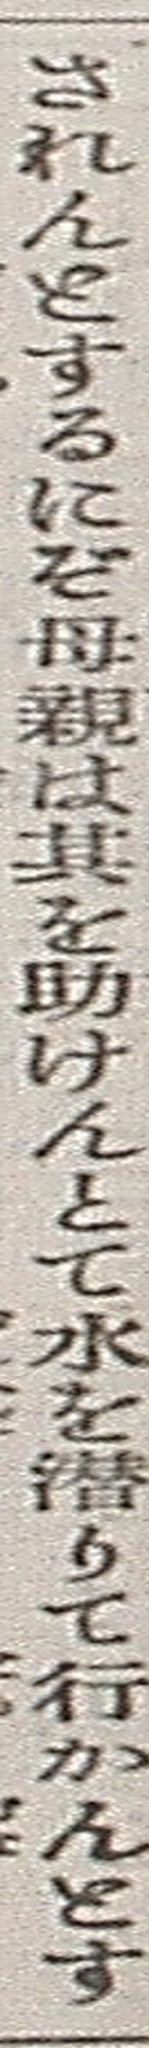されんとするにぞ母親は其を助けんとて水を潜りて行かんとす
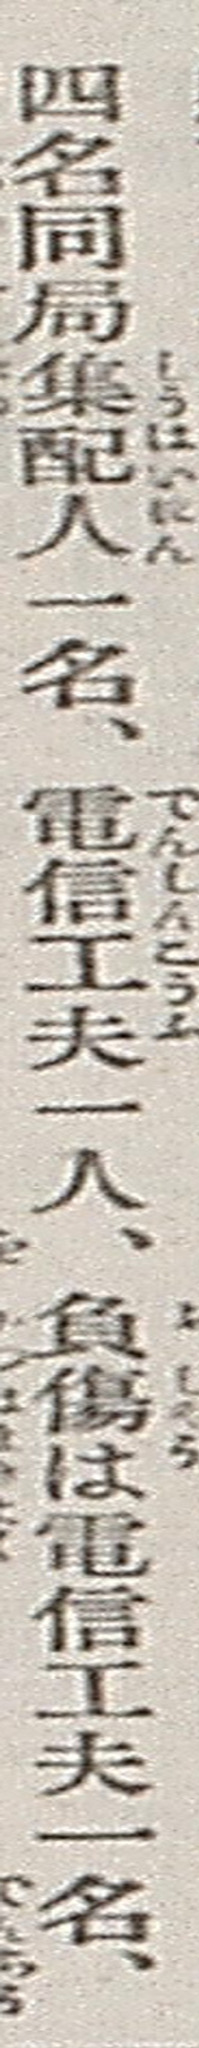四名同局集配人一名、電信工夫一人、負傷は電信工夫一名、
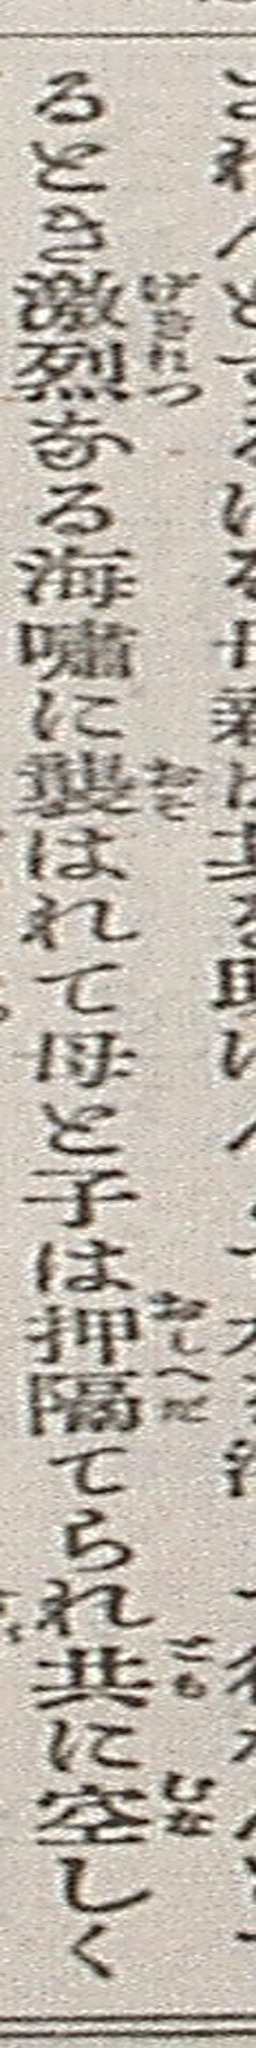るとき激烈なる海嘯に襲はれて母と子は押隔てられ共に空しく
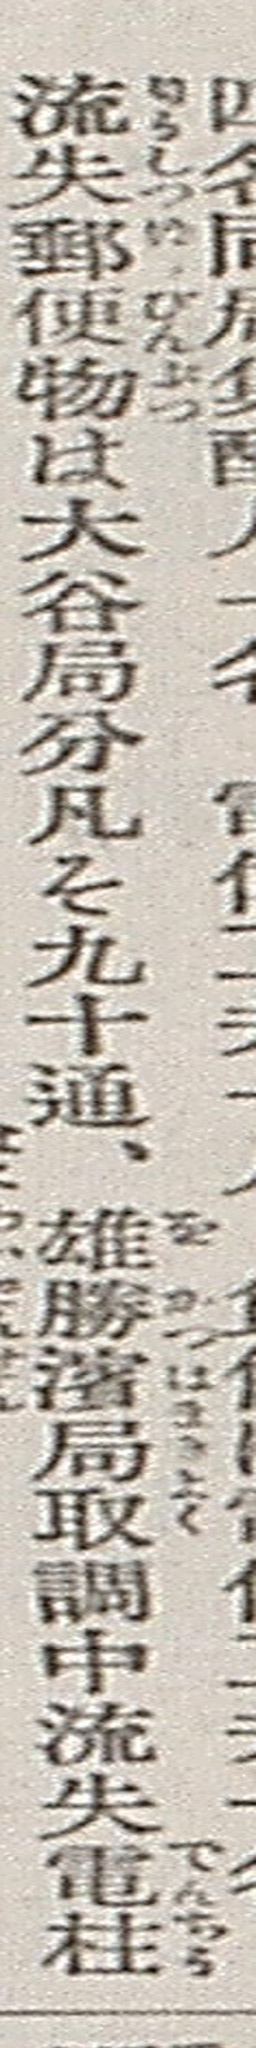流失郵便物は大谷局分凡そ九十通、雄勝浜局取調中流失電柱
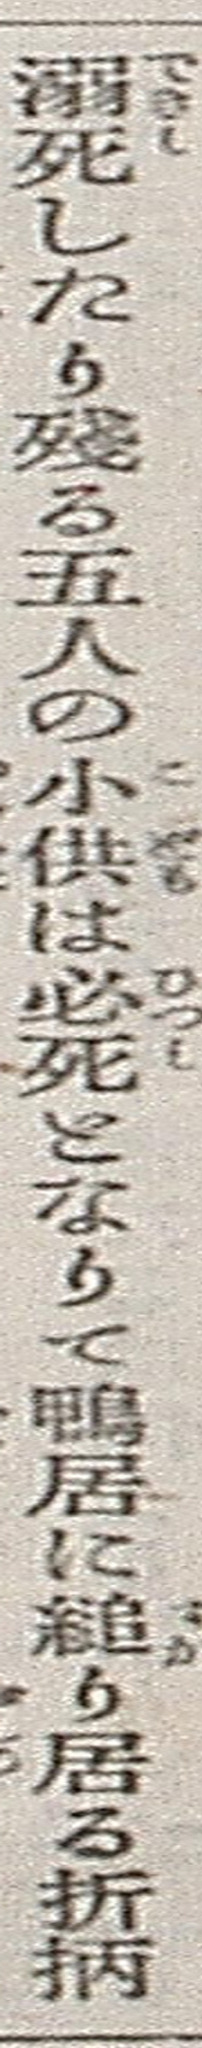溺死したり残る五人の小供は必死となりて鴨居に縋り居る折柄
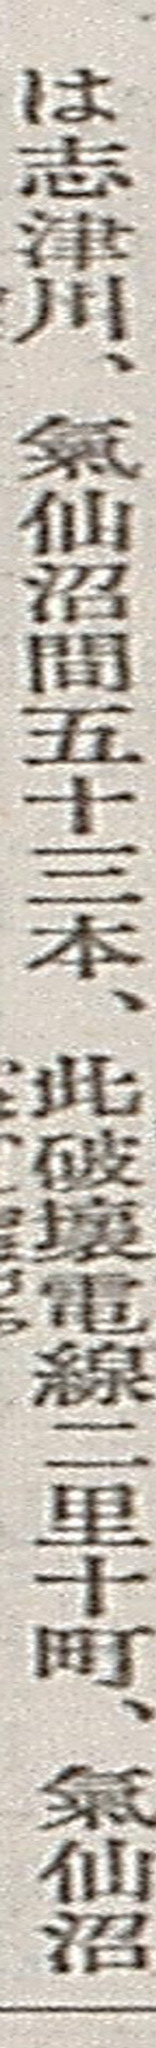は志津川、気仙沼間五十三本、此破壊電線二里十町、気仙沼
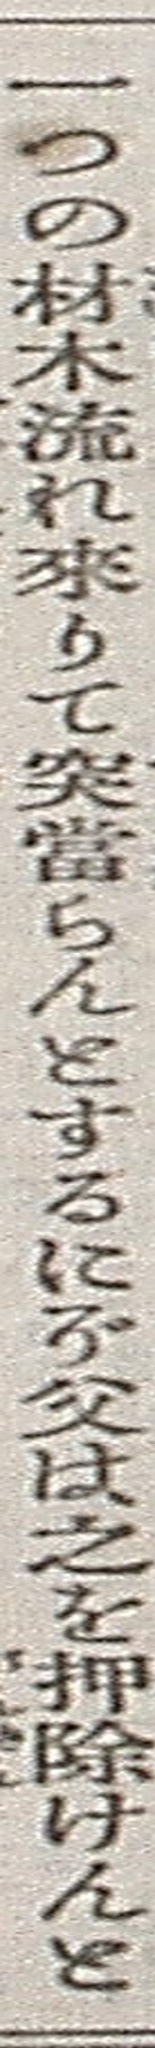一つの材木流れ来りて突当らんとするにぞ父は之を押除けんと
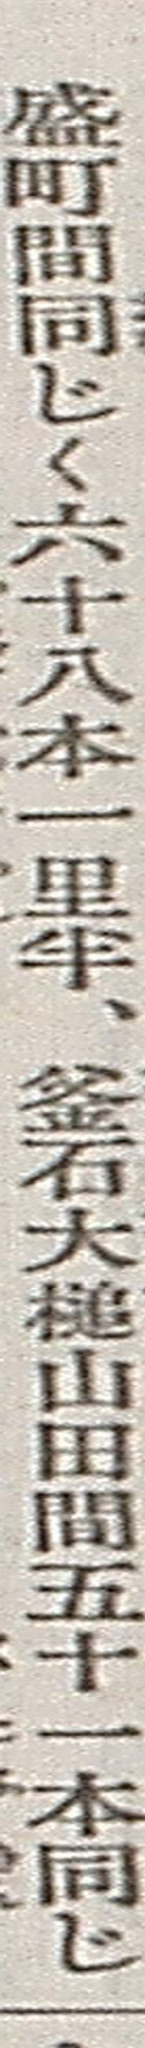盛町間同じく六十八本一里半、釜石大槌山田間五十一本同じ
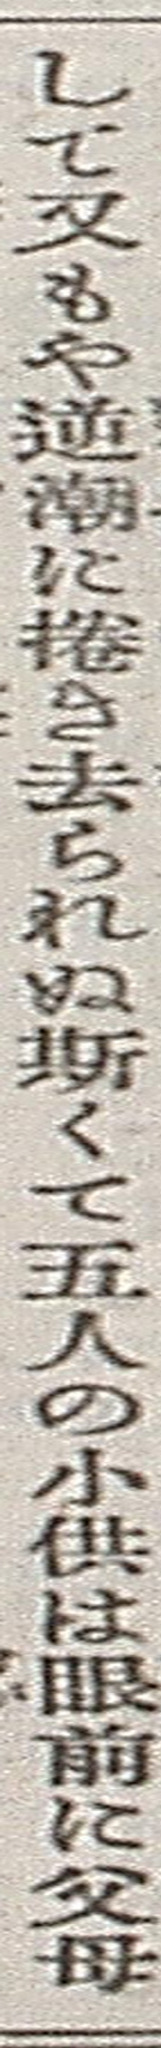して又もや逆潮に捲き去られぬ斯くて五人の小供は眼前に父母
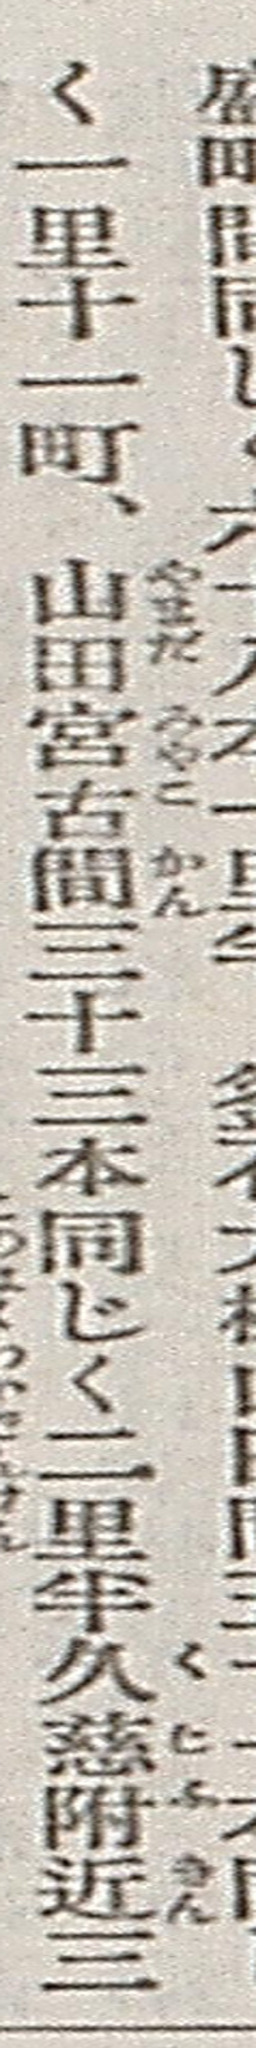く一里十一町、山田宮古間三十三本同じく二里半久慈付近三
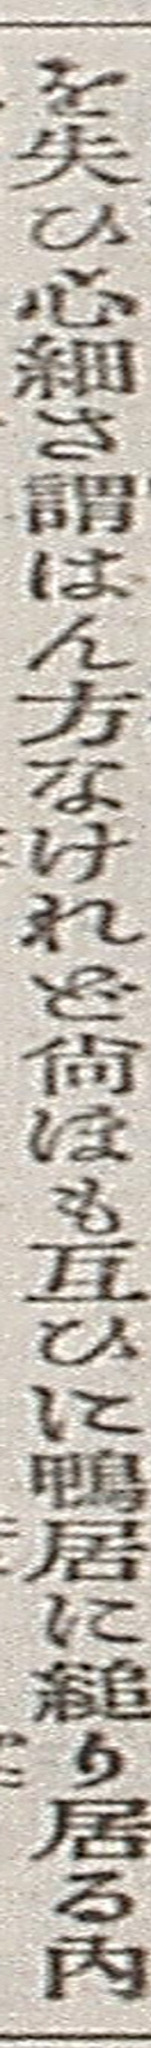を失ひ心細さ謂はん方なけれど尚ほも互ひに鴨居に縋り居る内
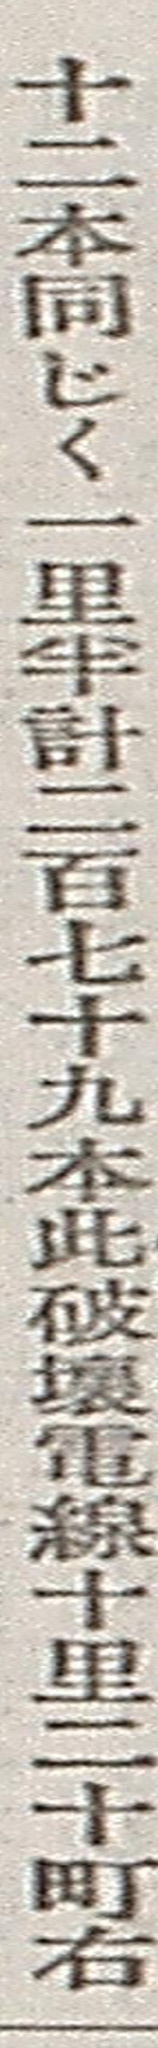十二本同じく一里半計二百七十九本此破壊電線十里二十町右
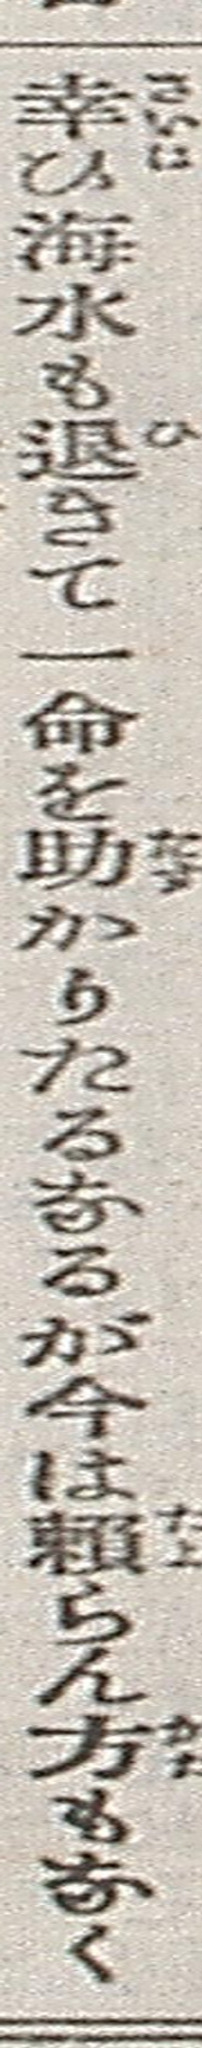幸ひ海水も退きて一命を助かりたるなるが今は頼らん方もなく
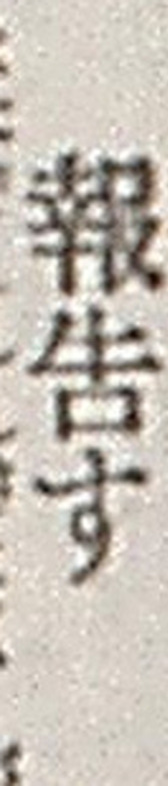報告す
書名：風俗畫報臨時増刊第百十九號　大海嘯被害録（中）
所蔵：東京大学地震研究所図書室 Earthquake Research Institute Library, The University of Tokyo, JAPAN
